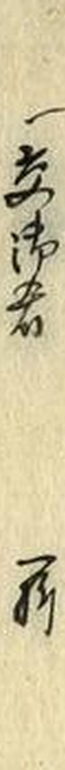交御肴一折
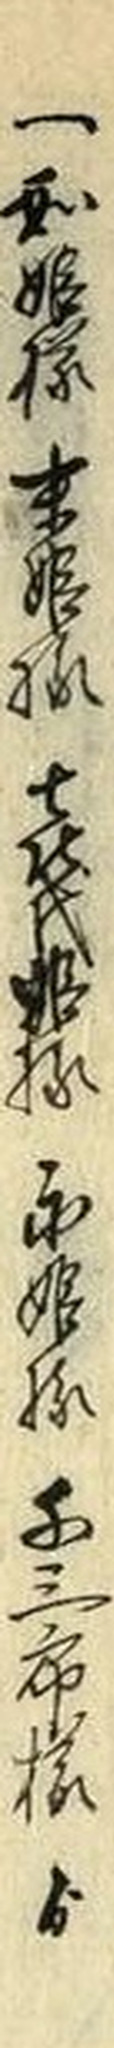一和姫様末姫様喜代姫様永姫様千三郎様ゟ
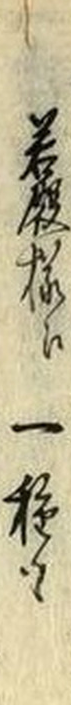若殿様江一種ツゝ
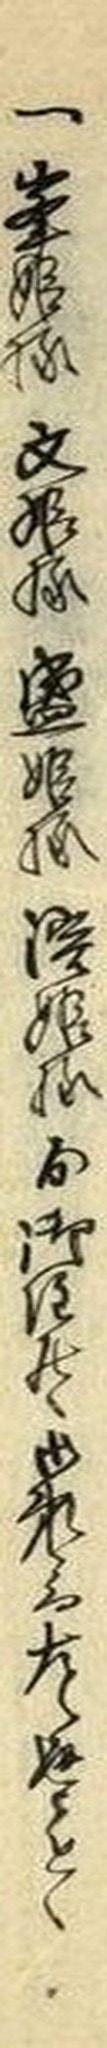一峯姫様文姫様盛姫様溶姫様ゟ御住居へ御頼ニ而左之通被進之
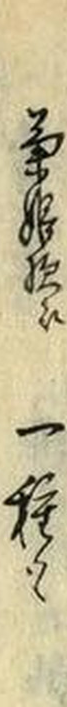菊姫様江一種ツゝ
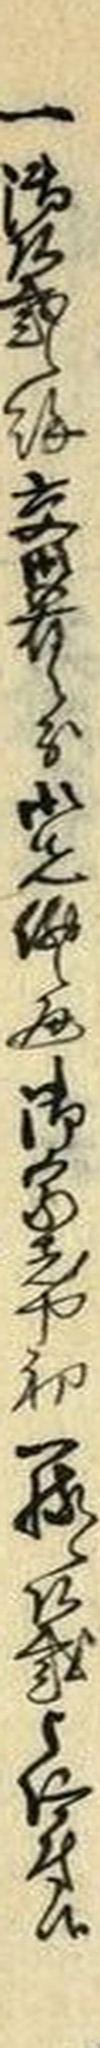一御頂戴候餘交御肴之分御先例之通御家老中初一統頂戴被仰付候
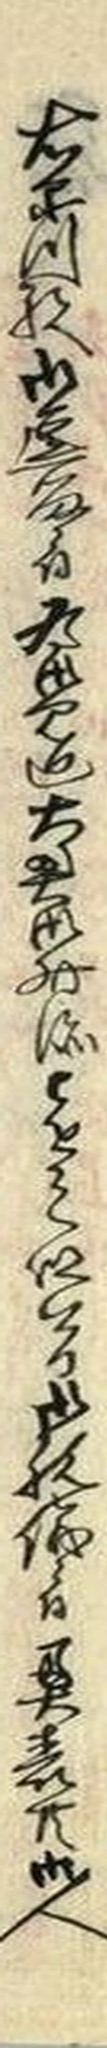右品川駅御逗留ニ付為御見廻大奥御文添被進之但今日御祝儀ニ付奥表共弐人
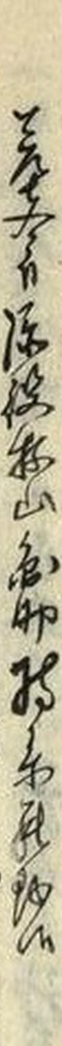差支ニ付添役林山円助持参罷越候
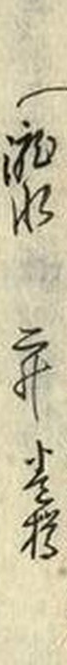瀧水二升巻樽
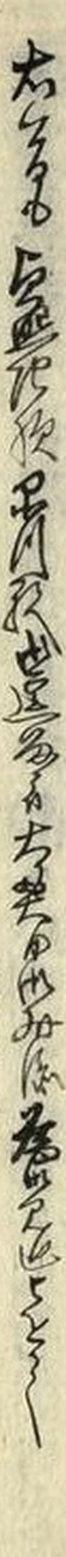右今日貞照院様品川駅御逗留ニ付大奥ゟ御文添為御見廻被進之
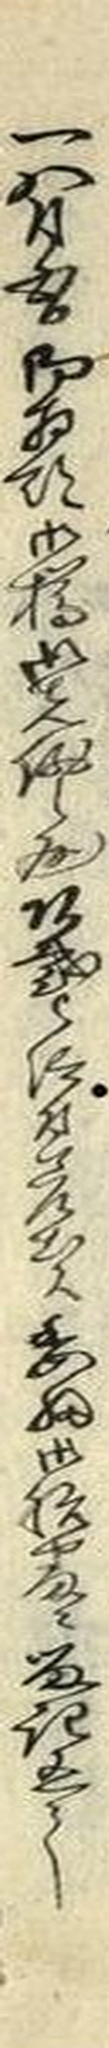一八月五日御拝領御樽御先例之通頂戴被仰付差出ス委細御膳番ニ留記有之
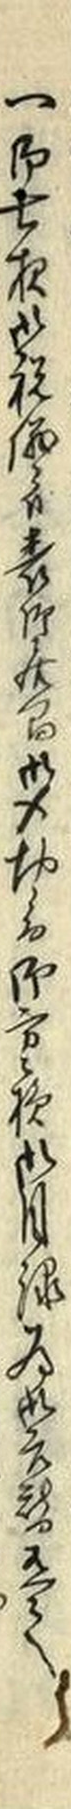一御七夜御祝儀ニ付表御居間御〆切ニ而御方々様御目録為御取替有之
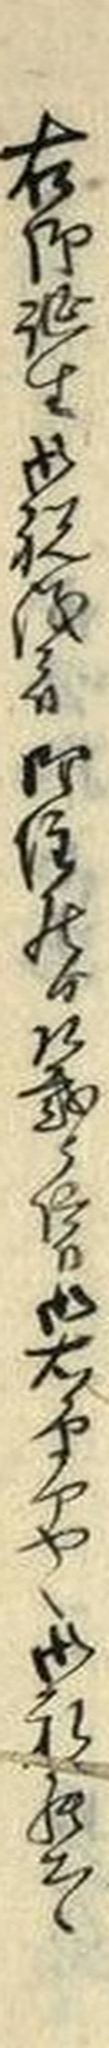右御誕生御祝儀ニ付御住居ゟ頂戴被仰付候御右筆部やへ御礼罷出候

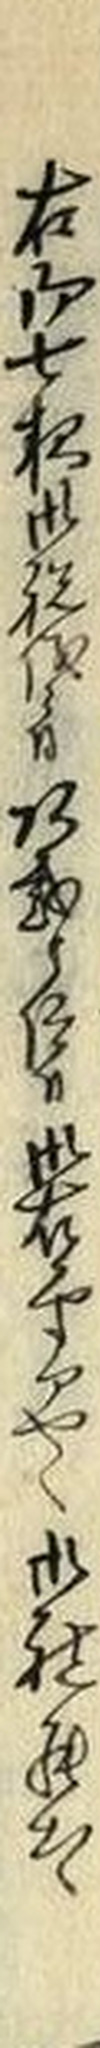右御七夜御祝儀ニ付頂戴被仰付候御右筆部やへ御礼罷出候
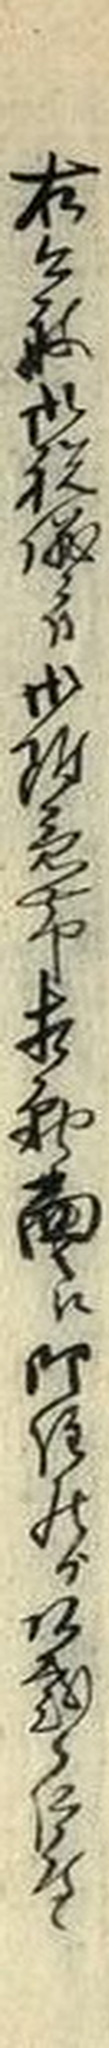右今般御祝儀ニ付御附兼帯相勤候面々江御住居ゟ頂戴被仰付候
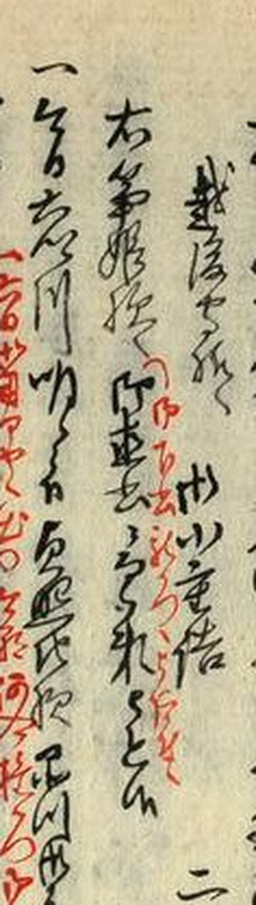右箏姫様へ御直書ニ而御頼被進之
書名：少傅日録抄（斉承付側向頭取日記、在府）
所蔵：福井県文書館 Fukui Prefectural Archives
